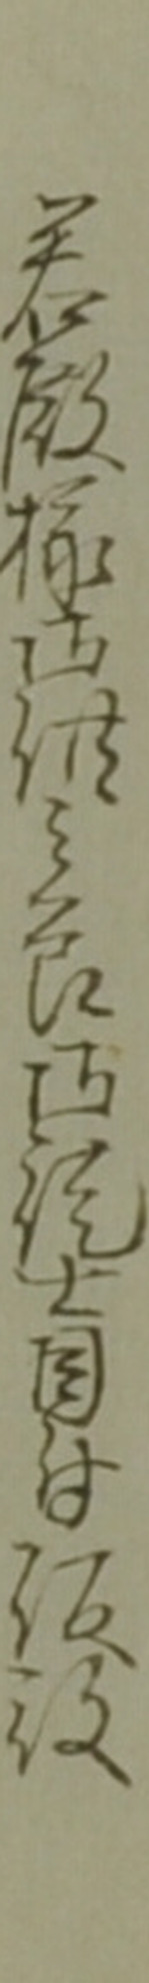若殿様御供之節御徒士目付仮役
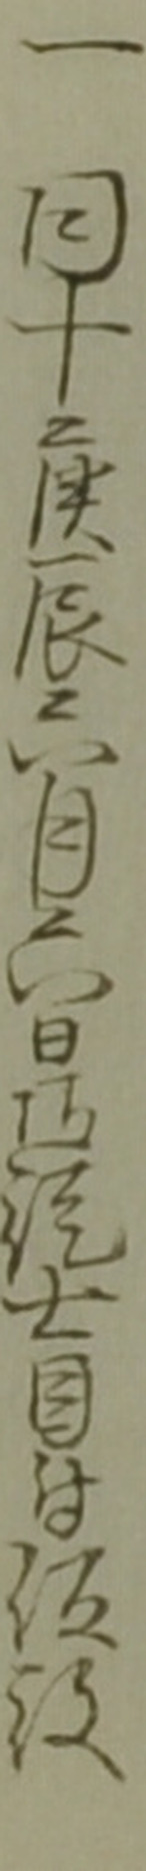一同十庚辰六月六日御徒士目付仮役
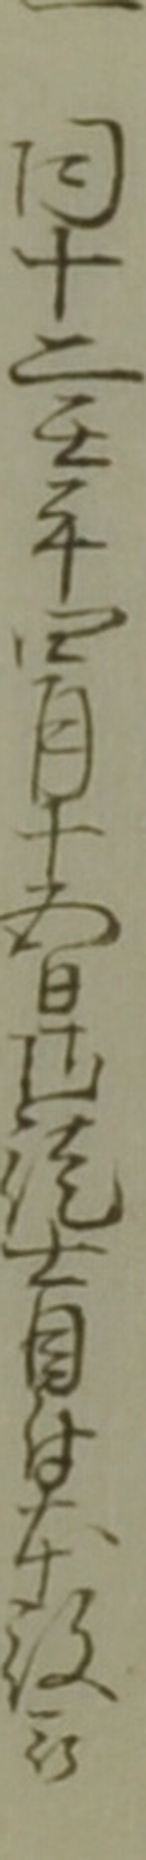一同十二壬午四月十五日御徒士目付本役被
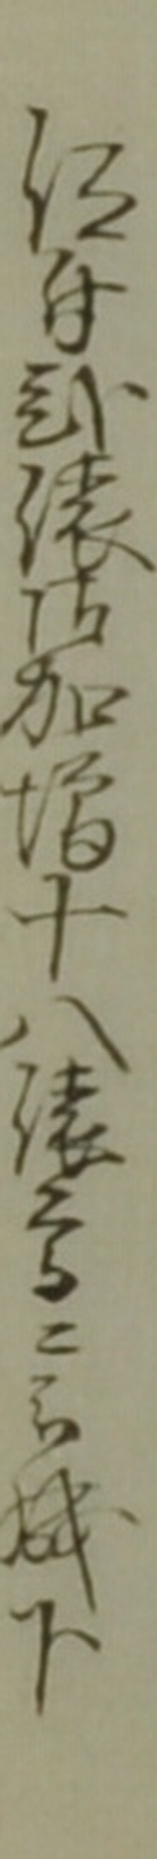仰付弐俵御加増十八俵高ニ被成下
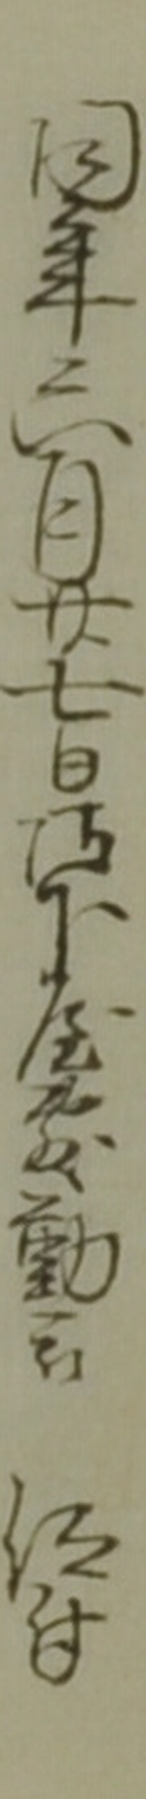一同年六月廿七日御下屋敷勤被仰付
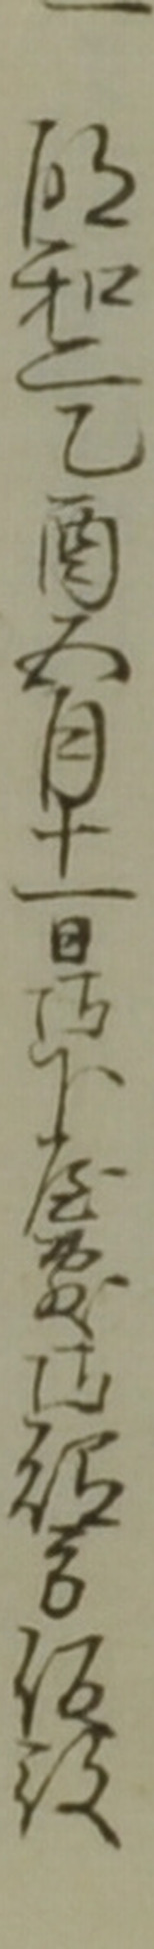一明和二乙酉五月十一日御下屋敷御賄方仮役
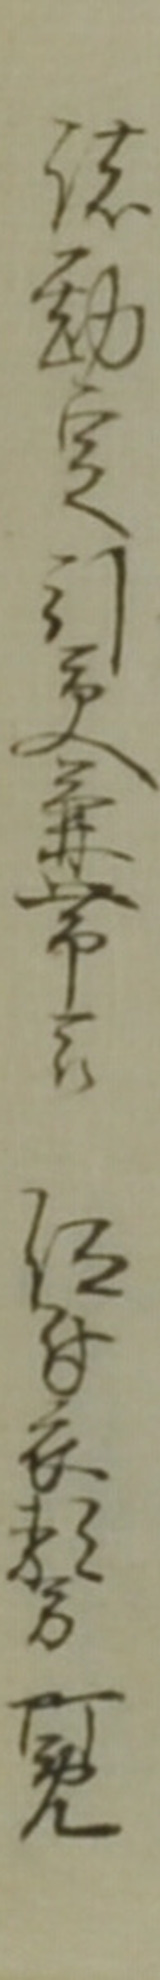諸勘定引受兼帯被仰付衣類方御免
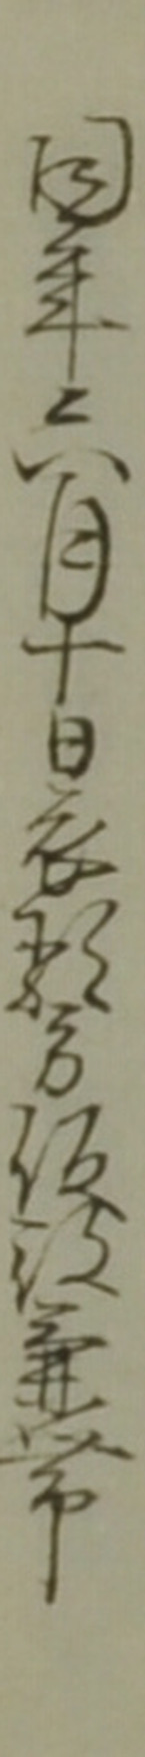一同年六月十日衣類方仮役兼帯
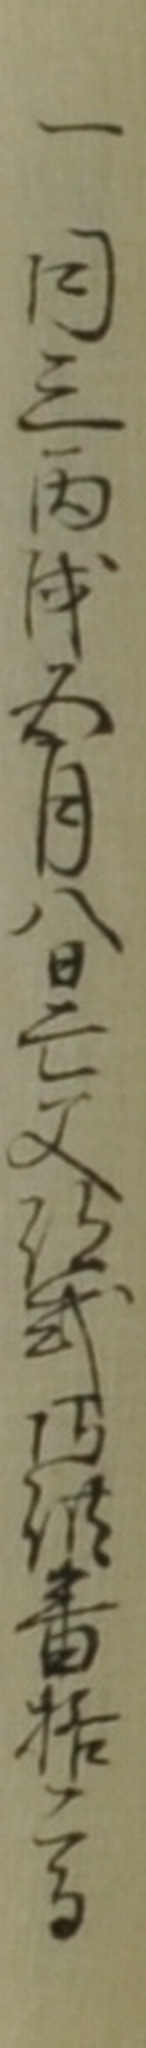一同三丙戌五月八日亡父跡式御供番格高
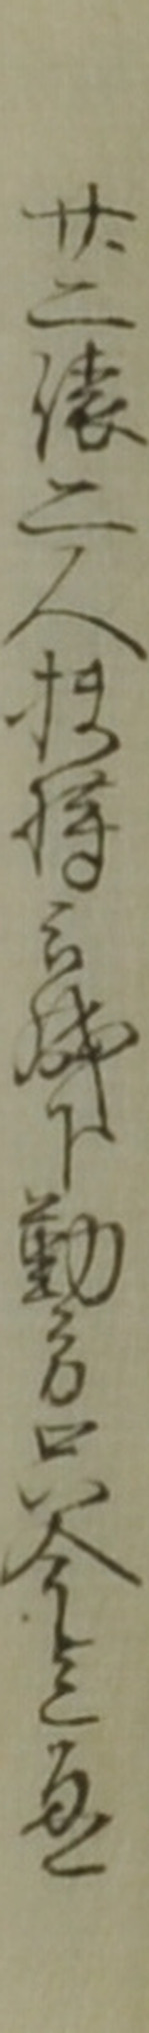廿二俵二人扶持被成下勤方只今迄通
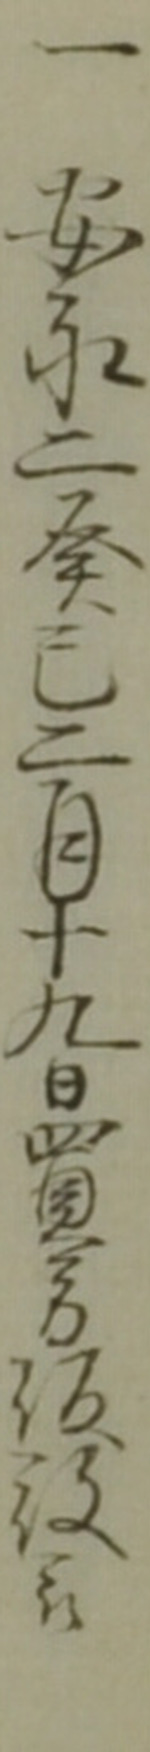一安永二癸巳二月十九日買方仮役被
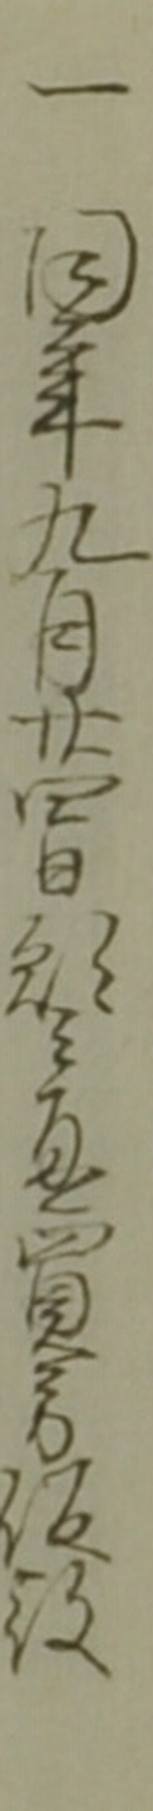一同年九月廿四日願之通買方仮役
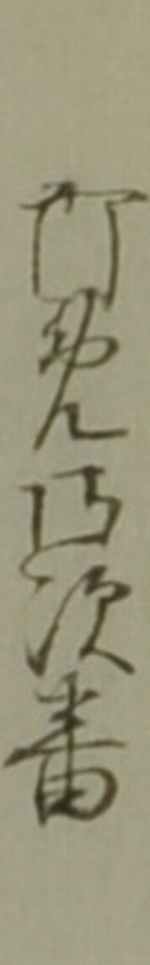御免御次番
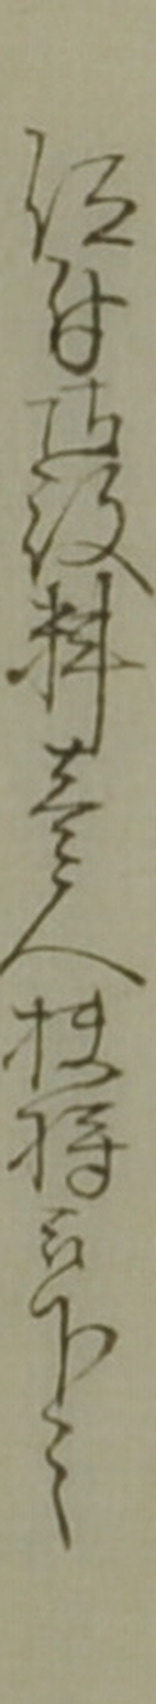仰付御役料壱人扶持被下之
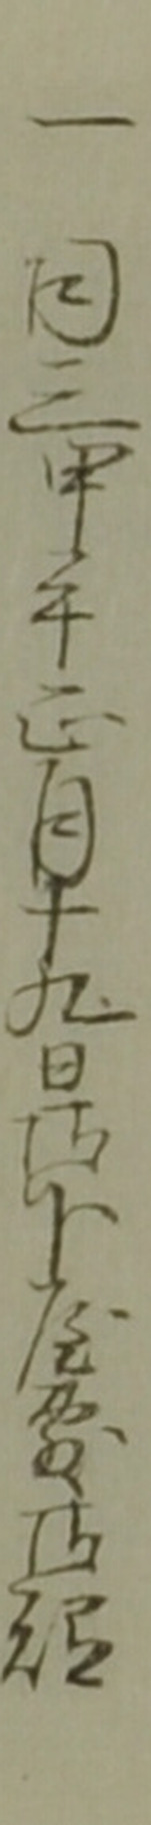一同三甲午正月十九日御下屋敷御賄
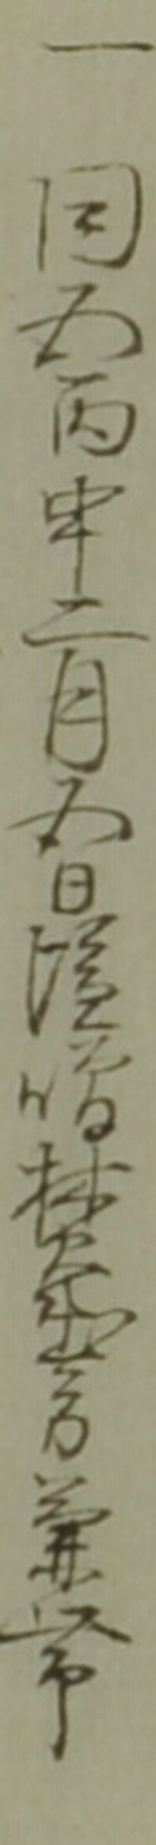一同五丙申二月五日塩噌焚出方兼帯
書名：無足諸士勤仕録（一）
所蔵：伊那市立高遠町図書館・合同会社AMANE
